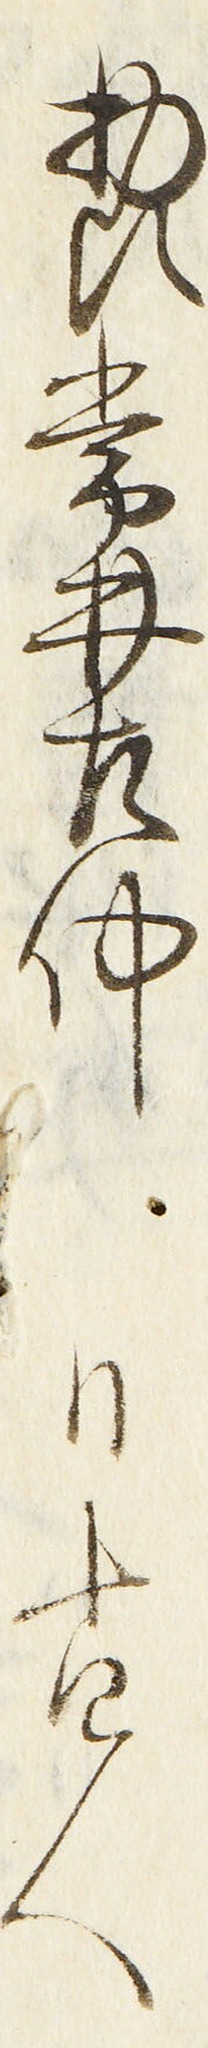物頭常井左仲〃十四人
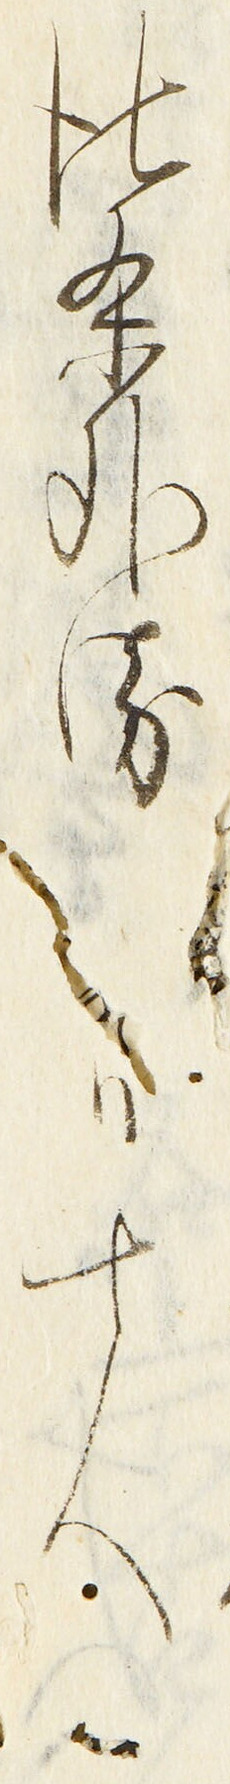北条外衛〃十人

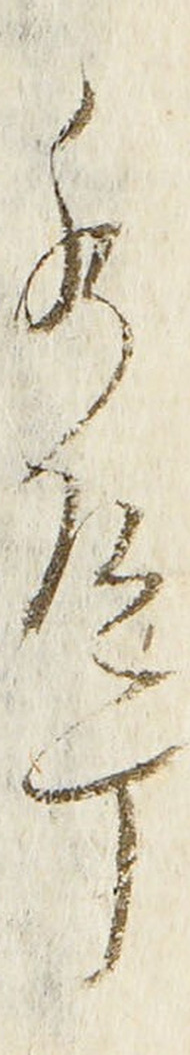水道丁
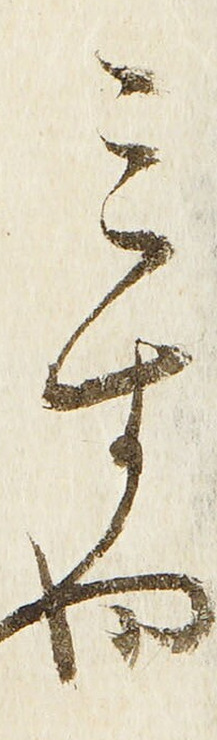みすや
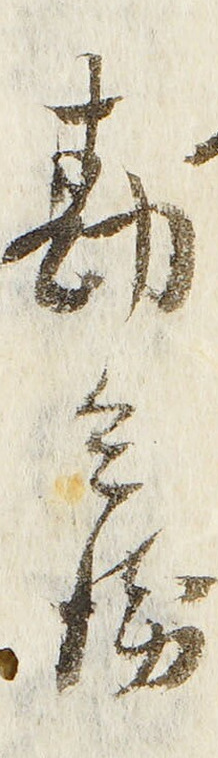勘兵衛
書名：魯西亜国舟渡来始末并日本流漂人異国遍歴之話（西洋欧羅巴州之内一）
